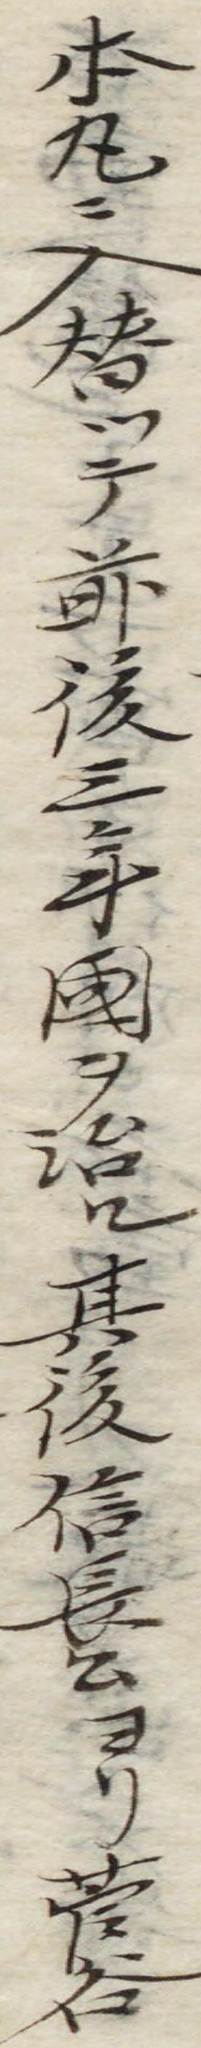本丸ニ入替ツテ前後三年国ヲ治ル其後信長公ヨリ菅谷
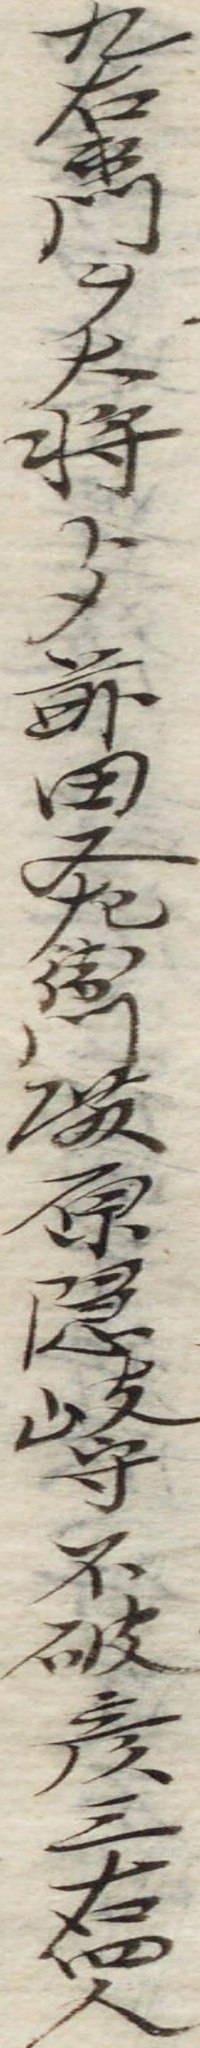九右衛門ヲ大将トメ前田又左衛門渋原隠岐守不破彦三右四人
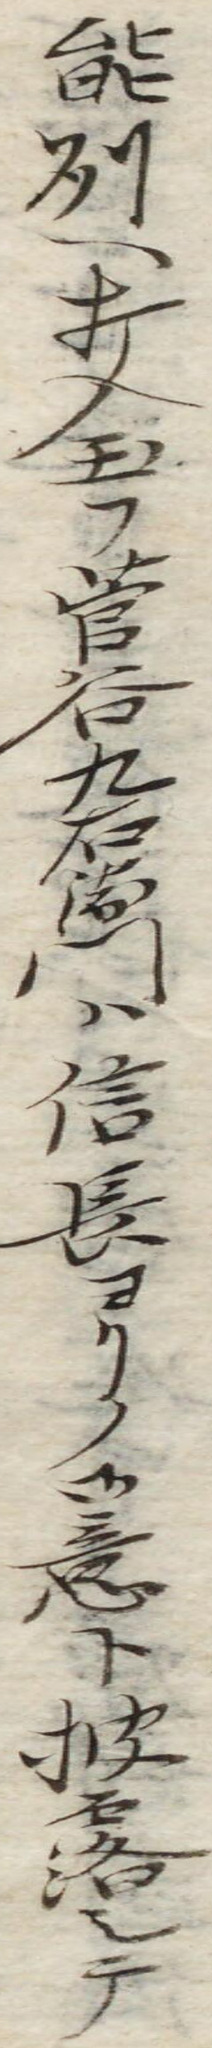能州へ打入玉フ菅谷九右衛門ハ信長ヨリノ御意ト被露シテ
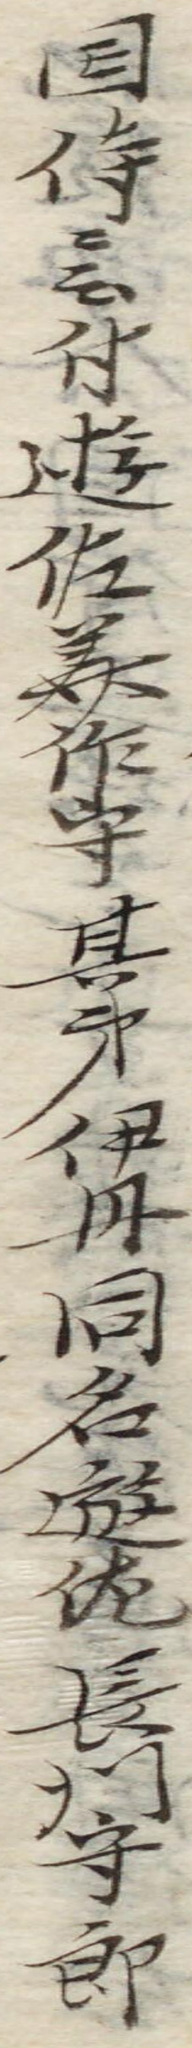国侍ニ云付遊佐美作守其弟伊丹同名遊佐長門守郎
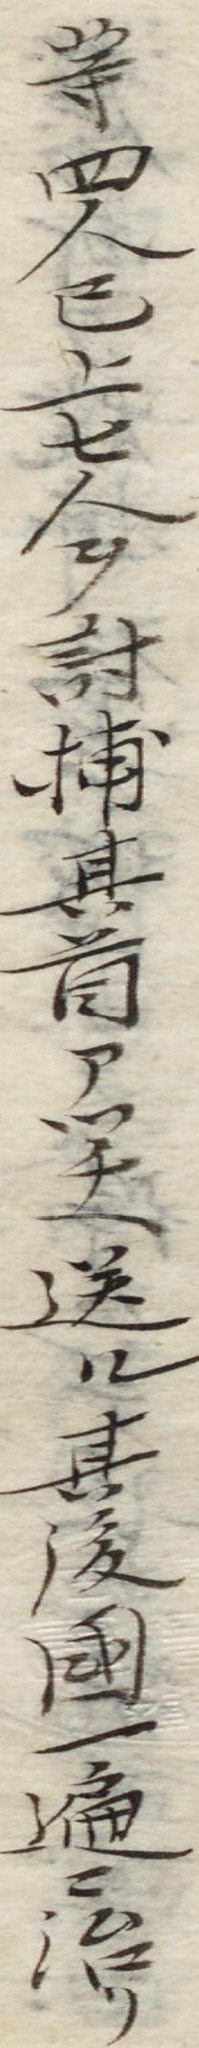等四人已上七人ヲ討捕其首アツチヘ送ル其後国一編ニ治リ
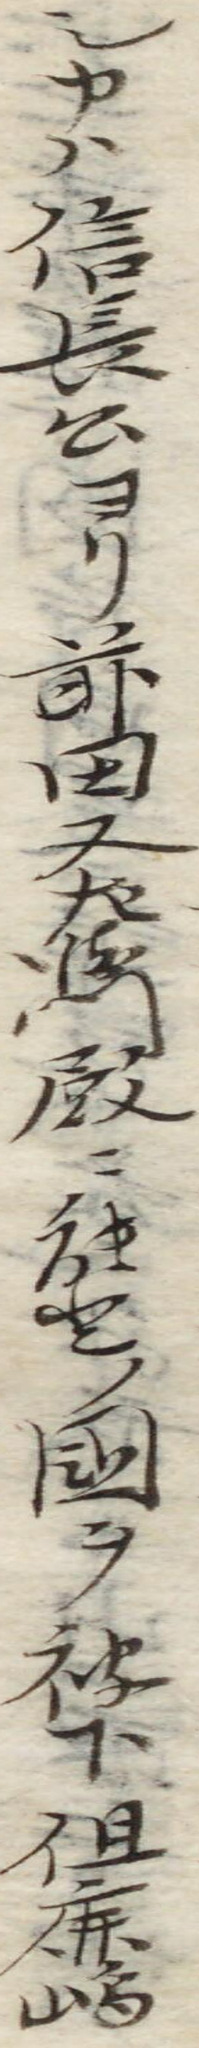シカハ信長公ヨリ前田又左衛門殿ニ能登ノ国ヲ被下但鹿嶋
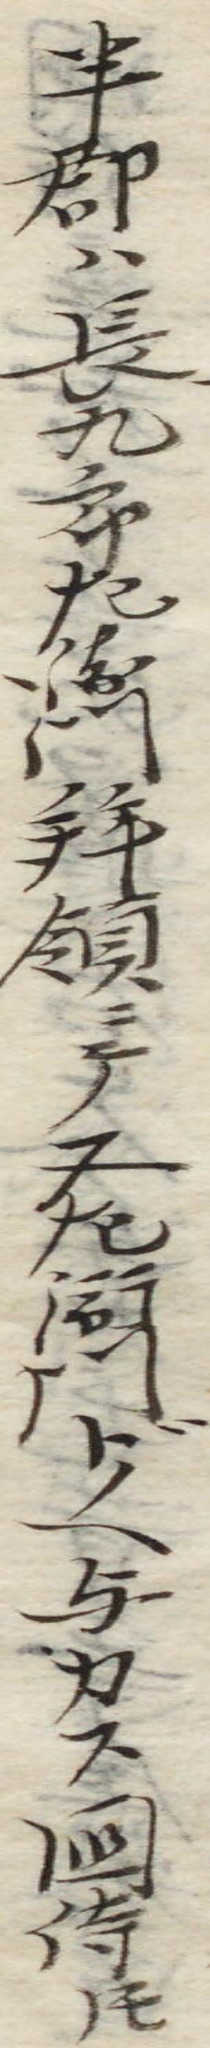半郡ハ長九郎左衛門拝領ニテ又左衛門ドノヘ与力ス国侍トモ
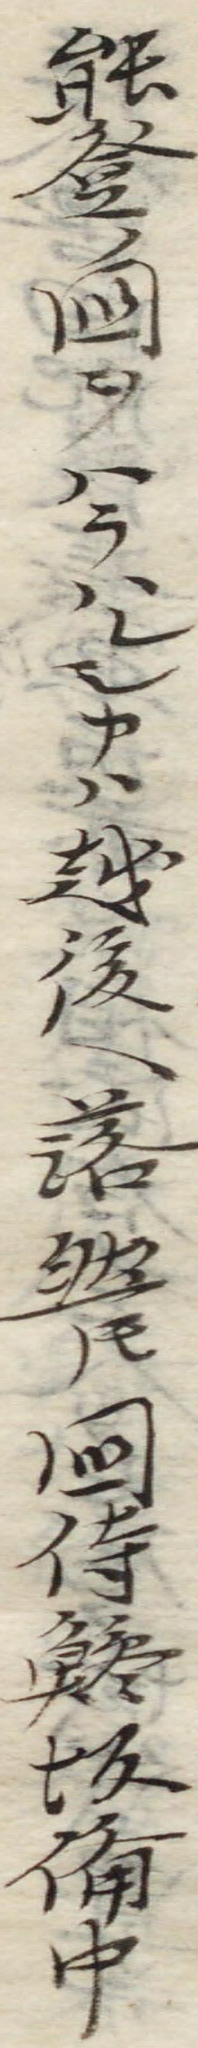能登ノ国ヲハラハレシカハ越後ヘ落然トモ国侍鰺坂備中
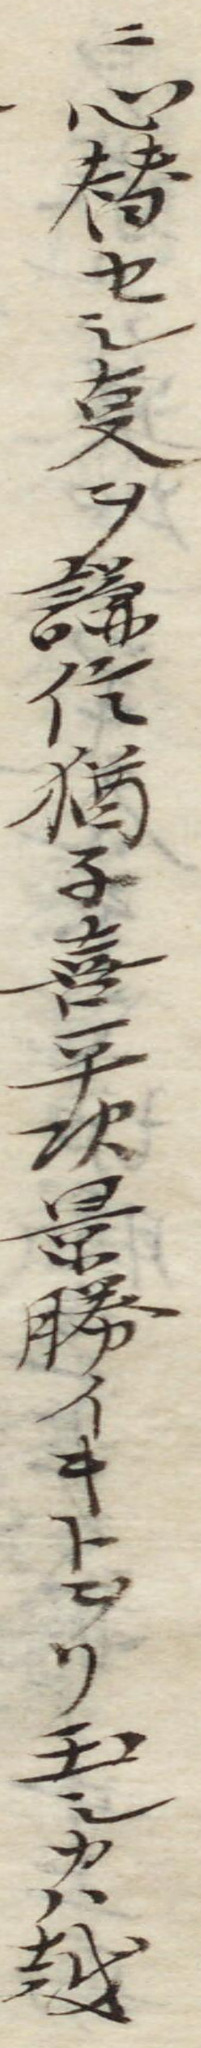ニ心替セシ事ヲ謙信猶子喜平次影勝イキトヲリ玉シカハ越
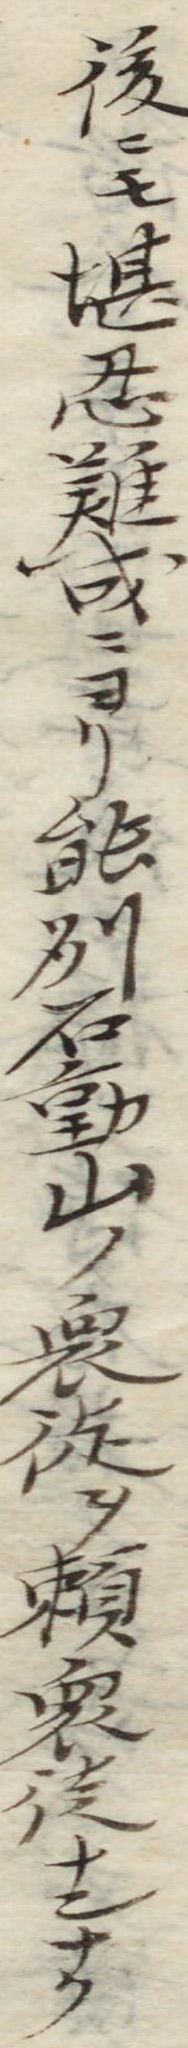後ニモ堪忍難成ニヨリ能州石動山ノ衆徒ヲ頼衆徒ナンナク
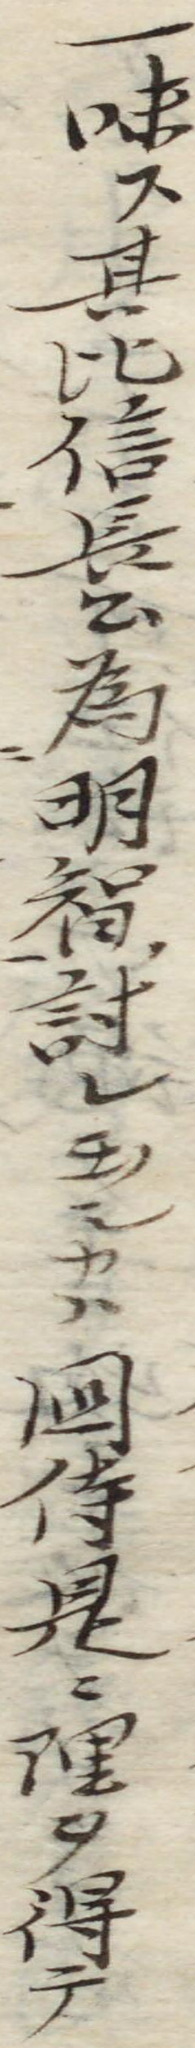一味ス其比信玄公為明智討レ玉シカハ国侍是ニ理ヲ得テ
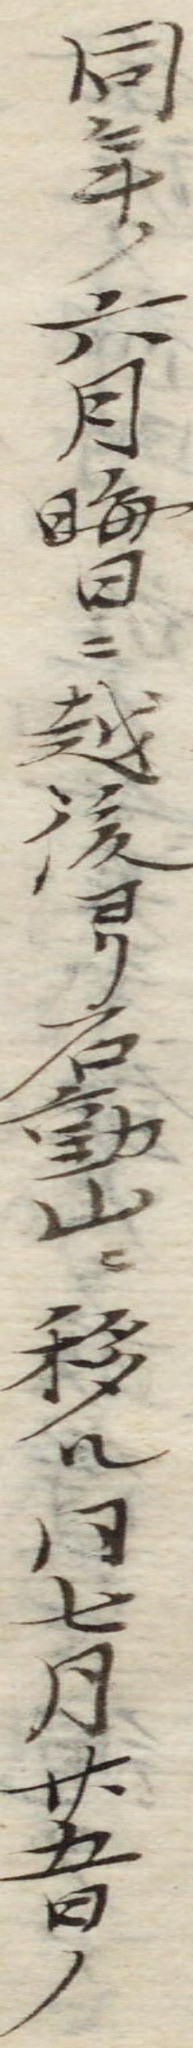同年ノ六月晦日ニ越後ヨリ石動山ニ移ル同七月廿五日ノ
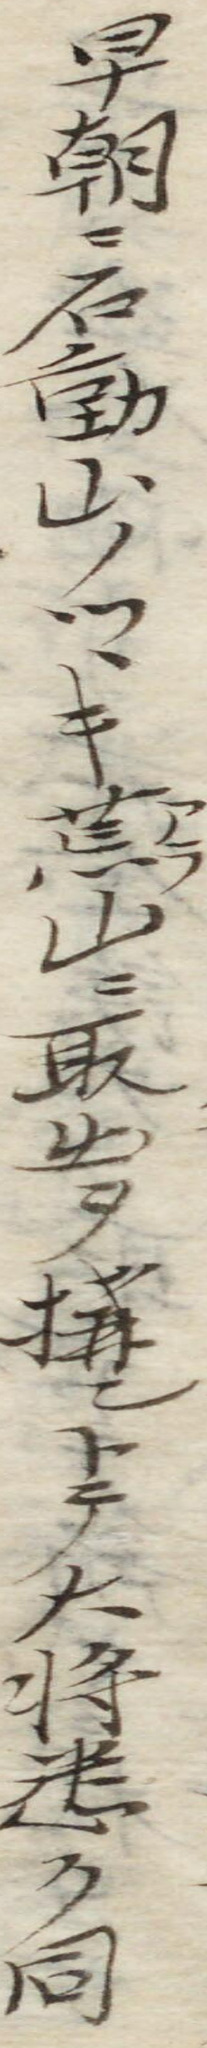早朝ニ石動山ノツ丶キ荒山ニ取出ヲ構ントテ大将悉ク同
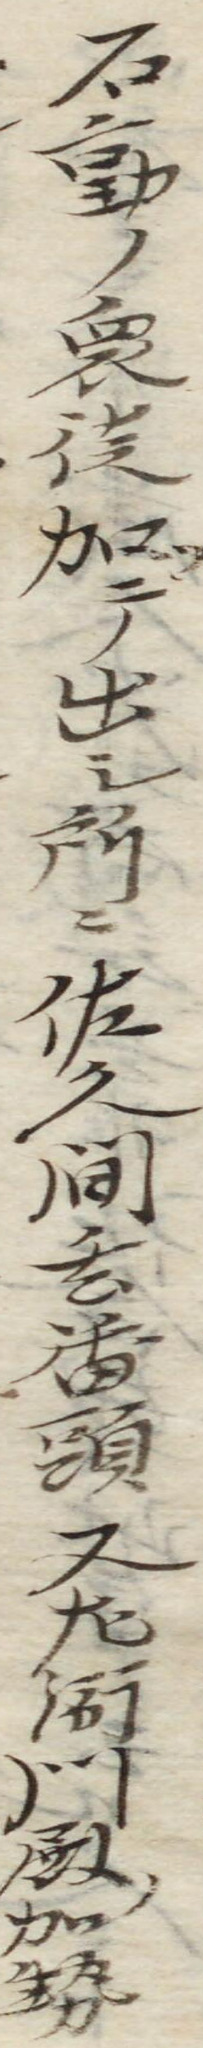石動ノ衆徒加ワテ出シ所ニ佐久間玄蕃頭又左衛門ノ加勢
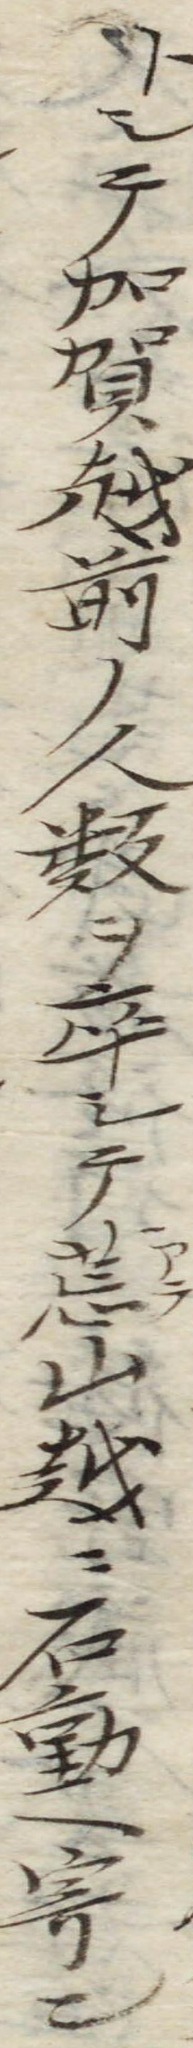トシテ加賀越前ノ人数ヲ率シテ荒山越ニ石動ヘ寄ン
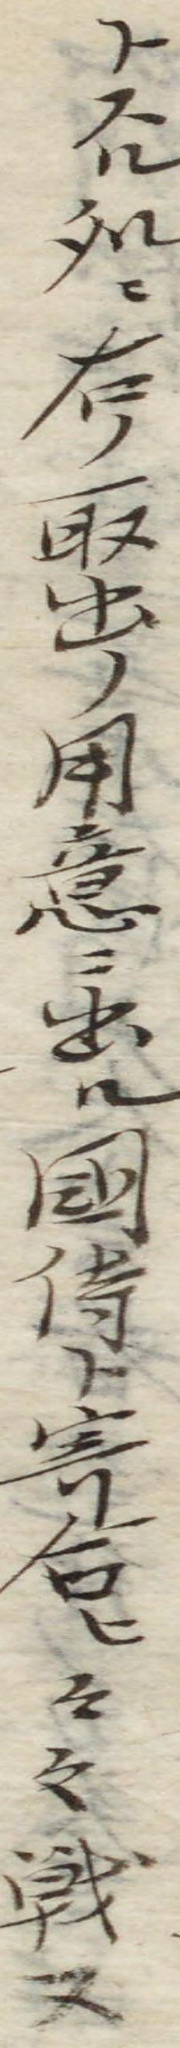トスル処ニ右ノ取出ノ用意ニ出ル国侍ト寄合々々戦ス
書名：聞見雑録
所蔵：Ishikawa Prefectural Library
